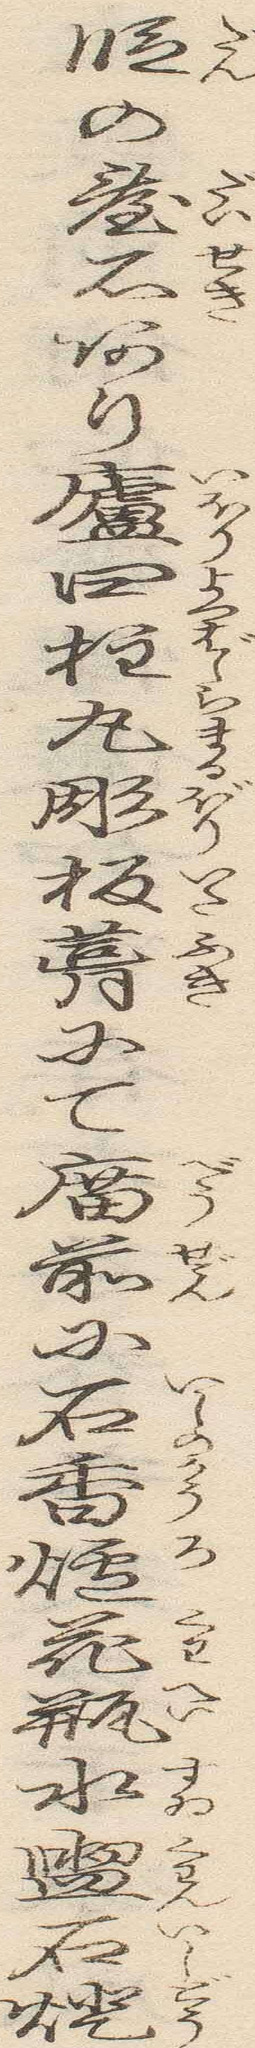段の臺石あり廬四柱丸彫板葺にて庿前に石香爐花瓶水盥石燈
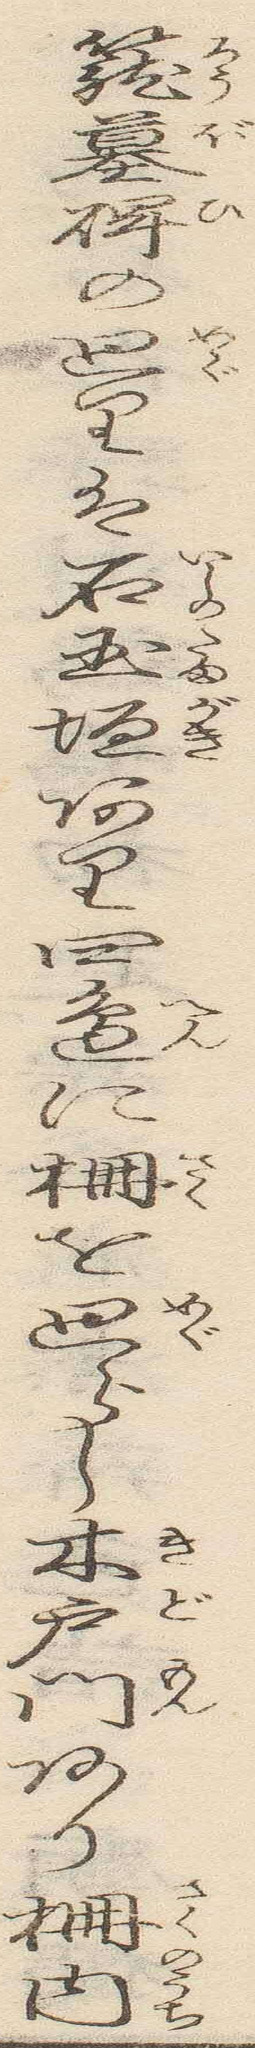籠墓碑の廻りは石玉垣あり四邊に柵を廻らし木戸門あり柵内
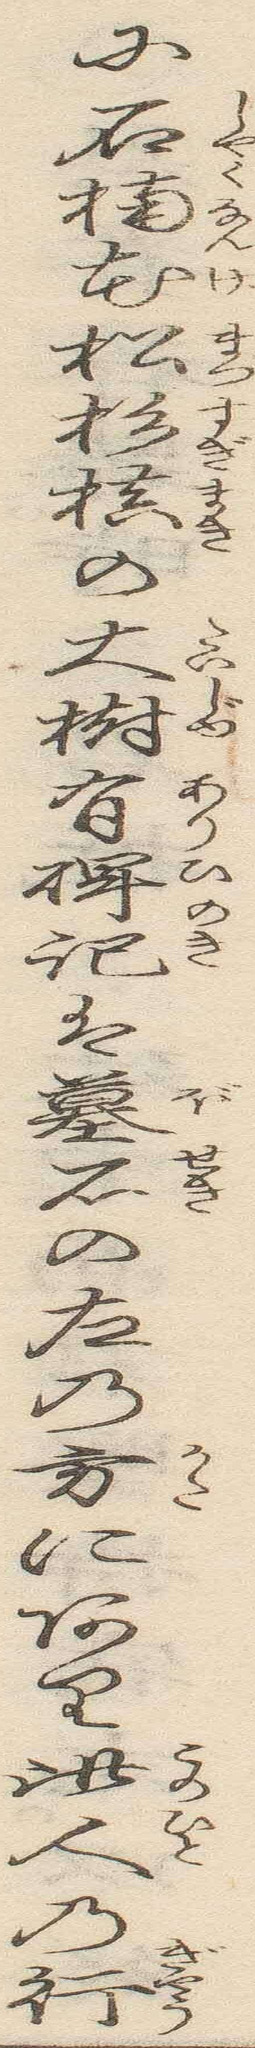に石楠花松杉槙の大樹有碑記は墓石の左の方にあり此人の行
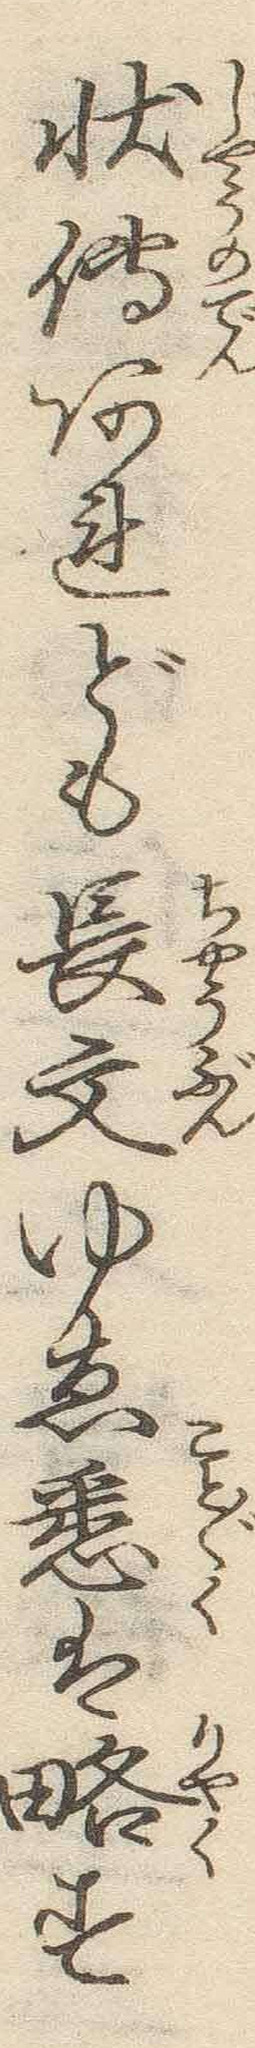状傳あれども長文ゆゑ悉は略す
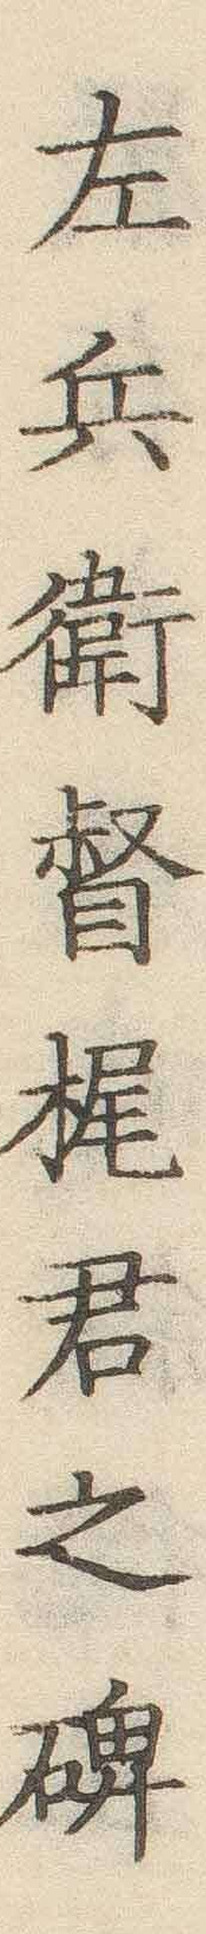左兵衛督梶君之碑
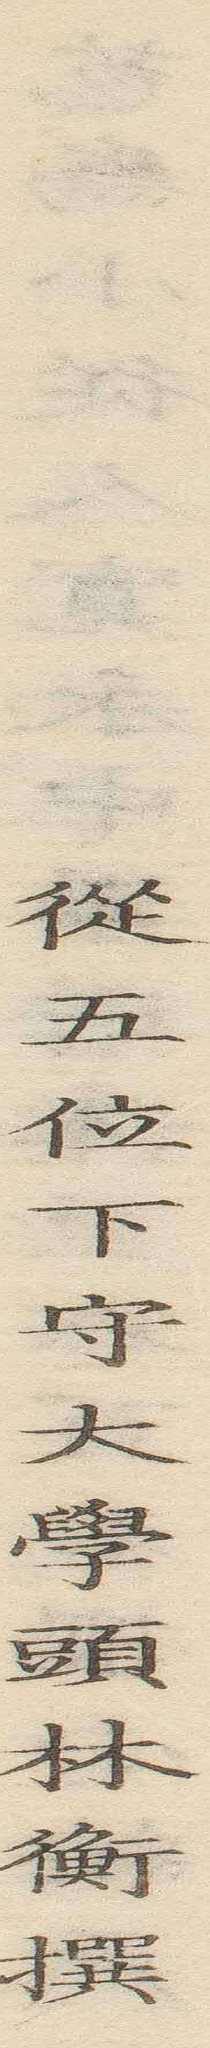從五位下守大學頭林衡撰
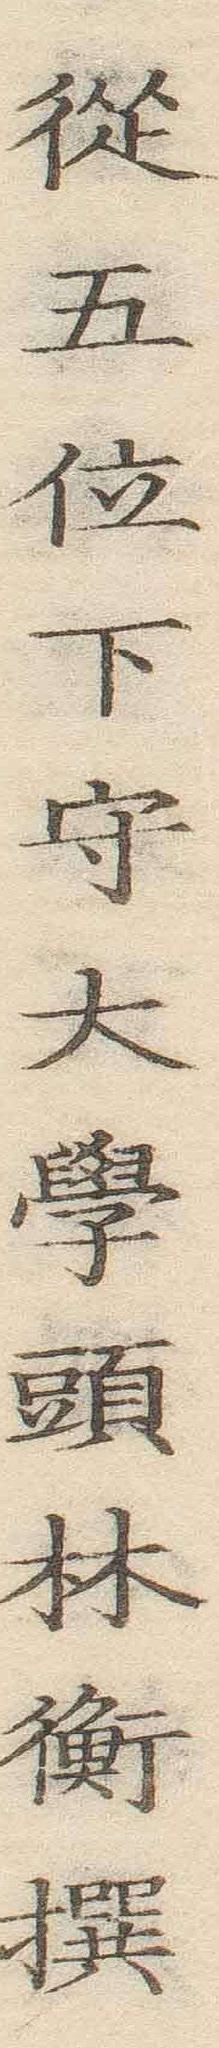從五位下守大學頭林衡撰
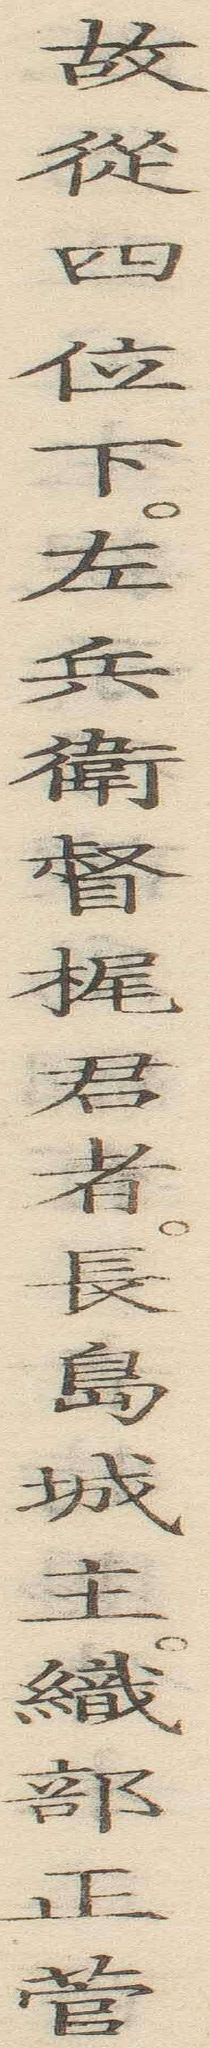故從四位下。左兵衛督梶君者。長島城主。織部正菅
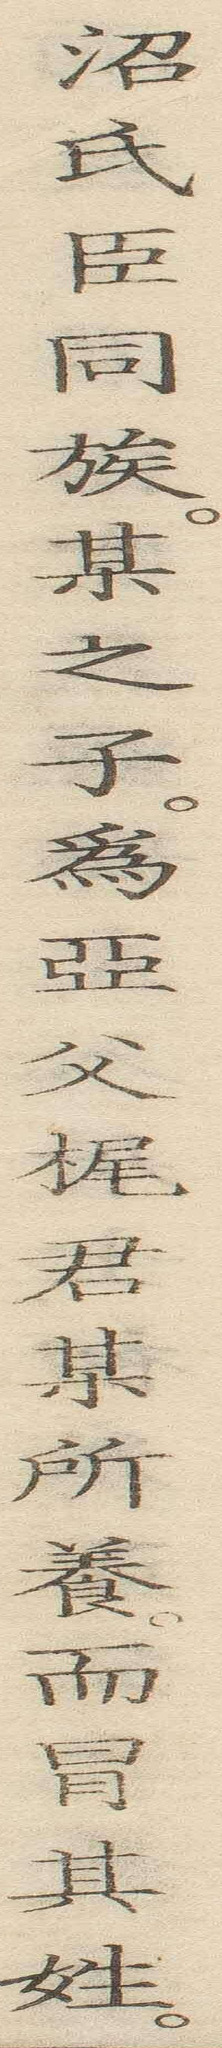沼氏臣同𫞀。某之子。爲亞父梶君某所養。而冐其姓。
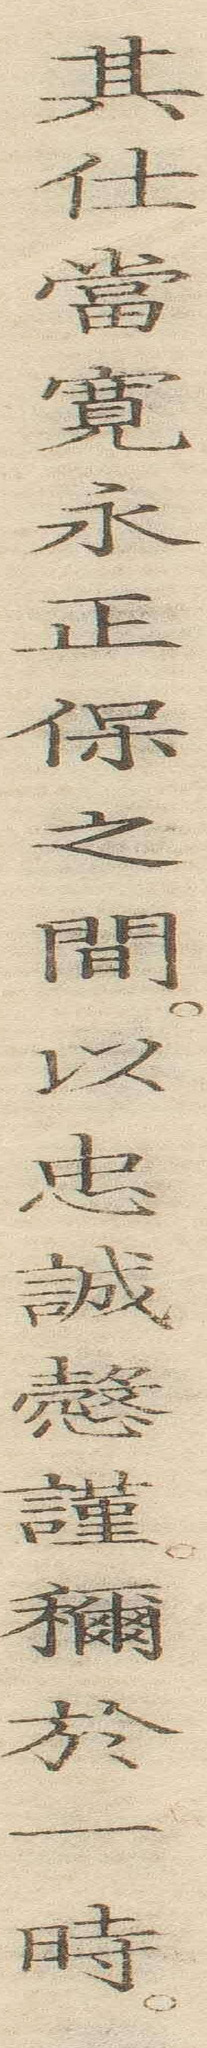其仕當寛永正保之間。以忠誠慤謹。彌於一時。
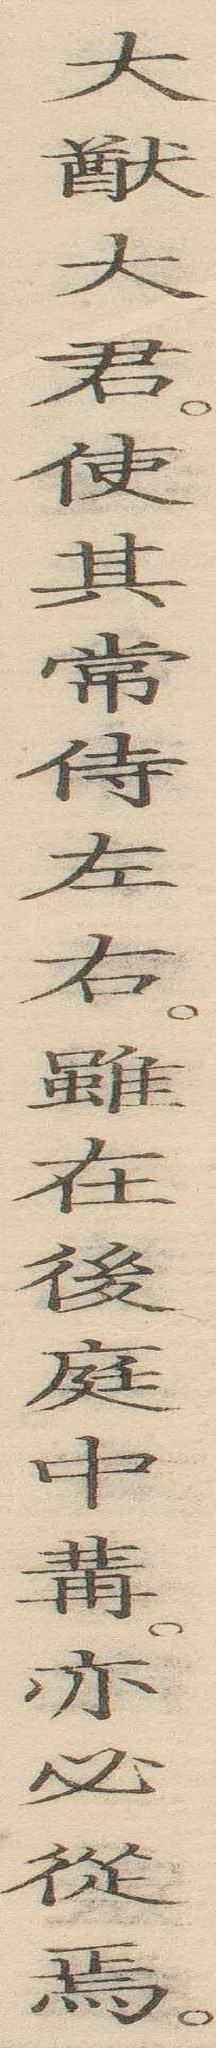大猷大君。使其常侍左右。雖在後庭中冓。亦必從焉。

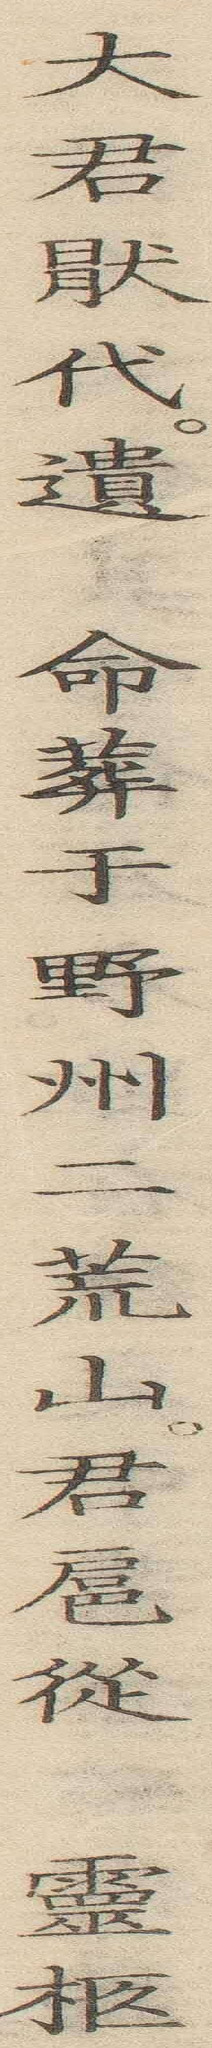大君猒代。遺命葬于野州二荒山。君扈從靈柩
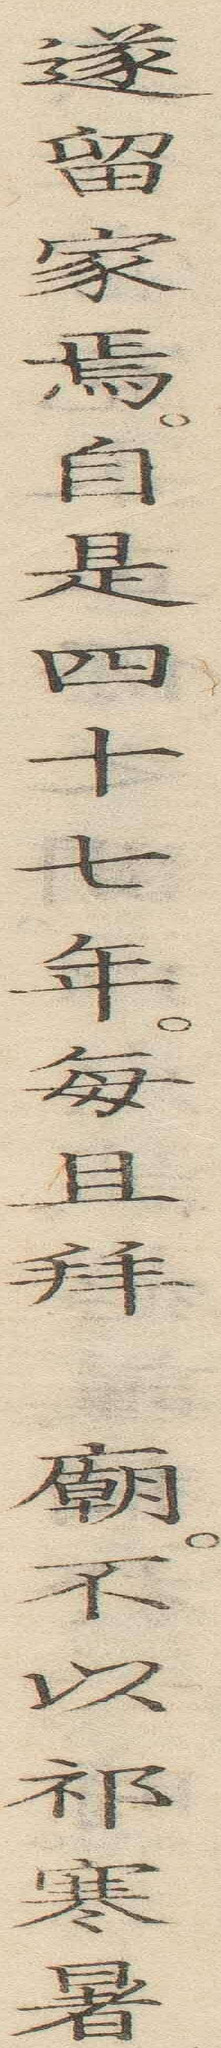遂留家焉。自是四十七年。每且拜廟。不以祁寒暑
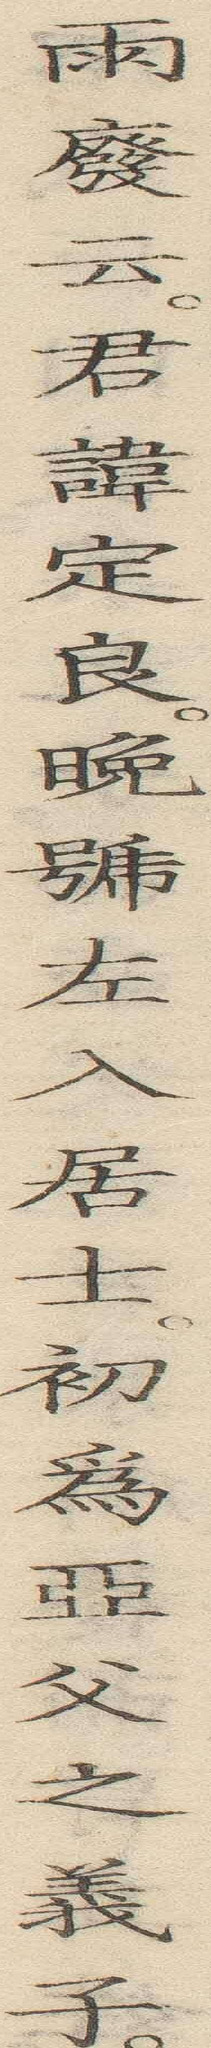雨廢云。君諱定良。晩號左入居士。初爲亞父之義子。
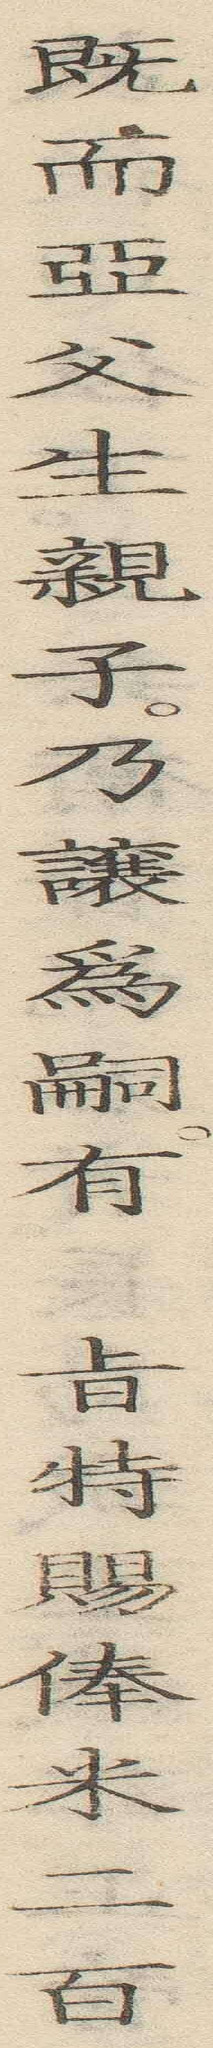既而亞父生親子。乃譲爲嗣。有㫖特賜俸米二百
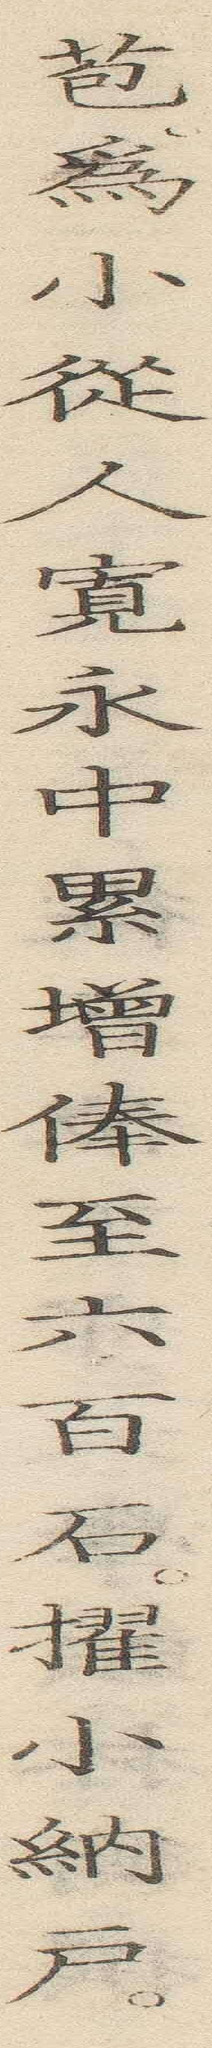苞。爲小從人寛永中累增俸至六百石。擢小納戸。
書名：日光山志
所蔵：東京学芸大学附属図書館 国文学研究資料館
